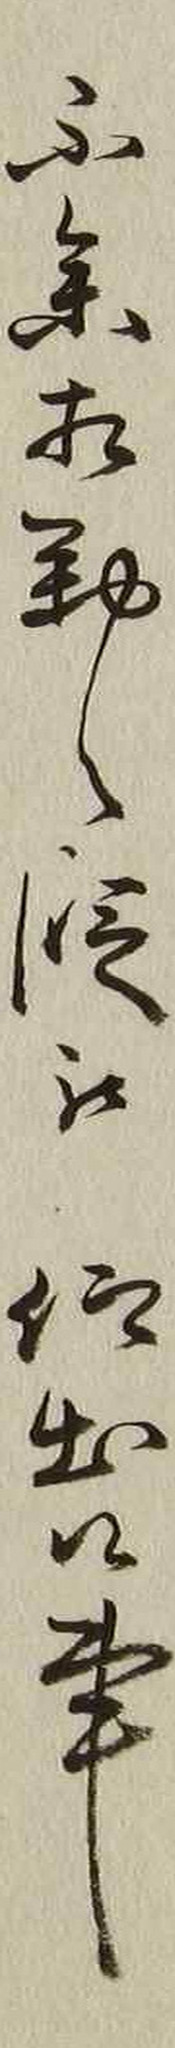不参相勤候段被仰出候事
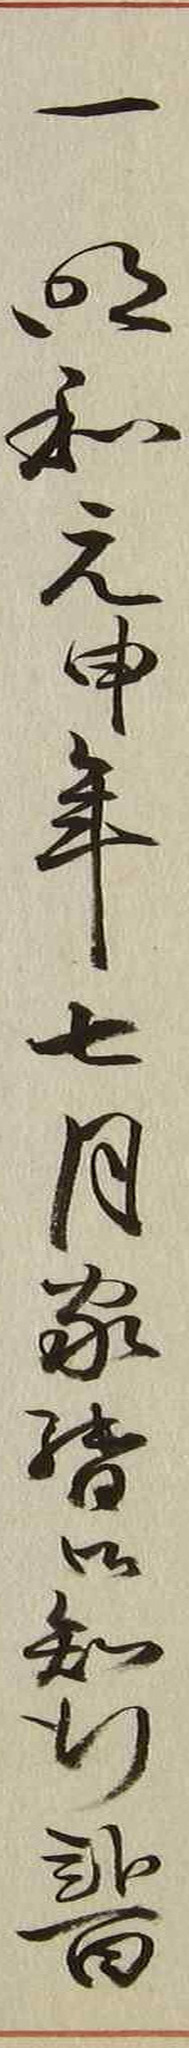一明和元申年七月家督御知行弐百
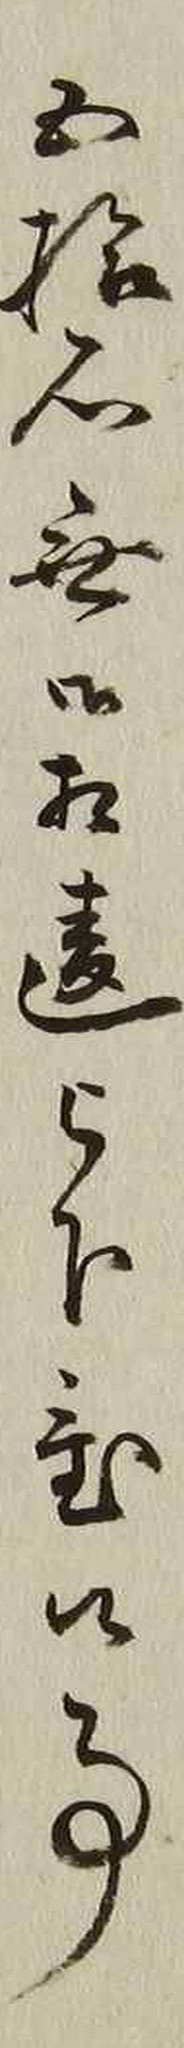五拾石無御相違被下置候事
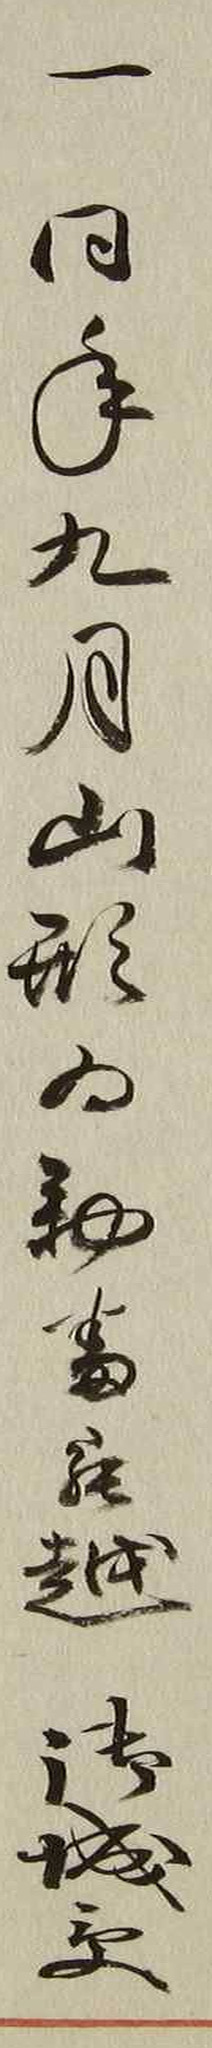一同年九月山形為勤番罷越御城受
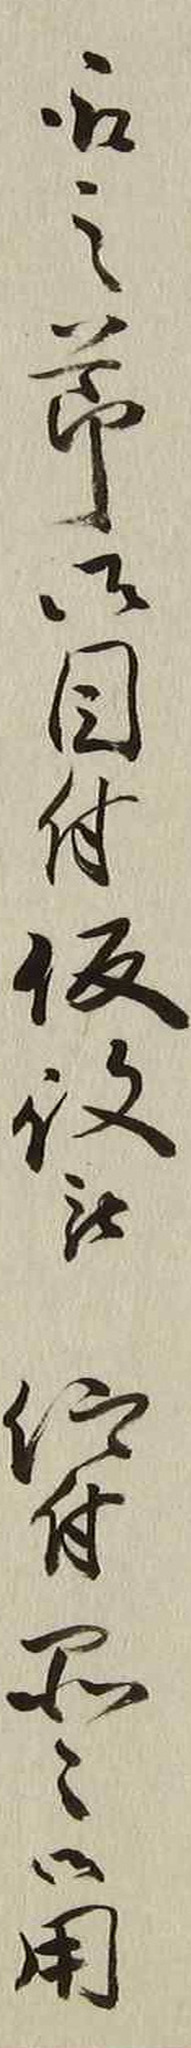取之節御目付仮役被仰付品々御用
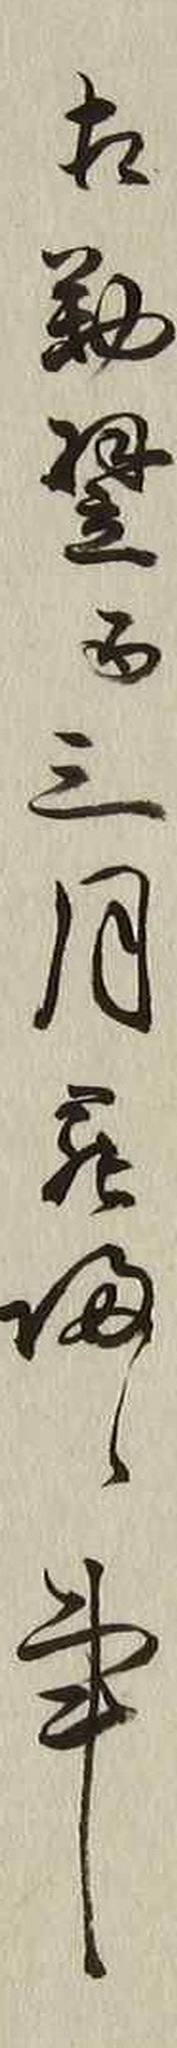相勤翌酉而三月罷帰候事
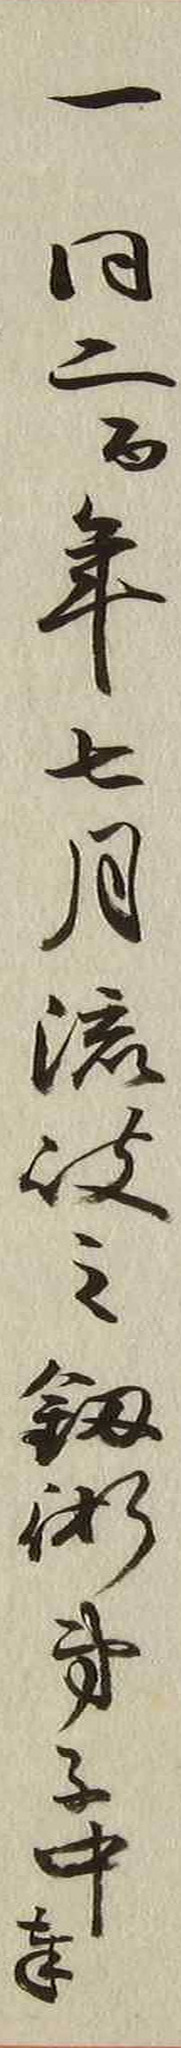一同二酉年七月流岐之剣術弟子中奉
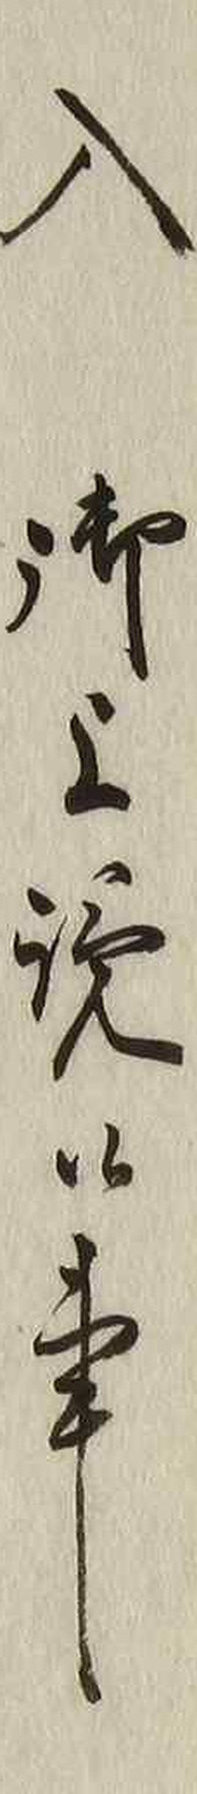入御上覧候事
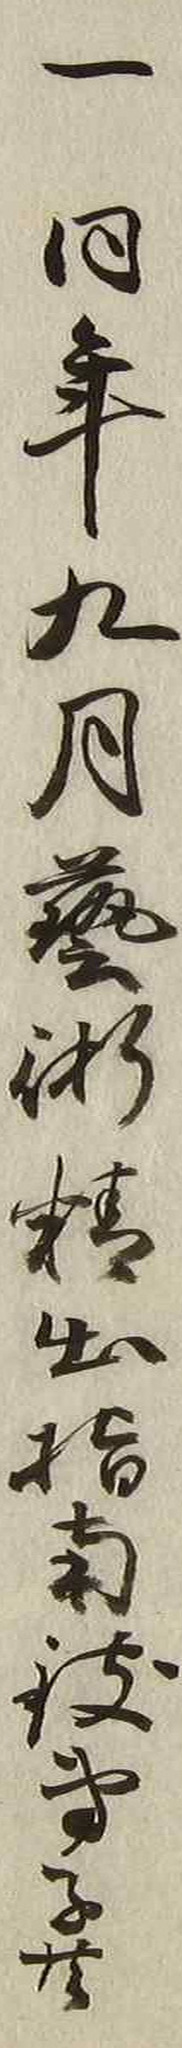一同年九月芸術精出指南致弟子共
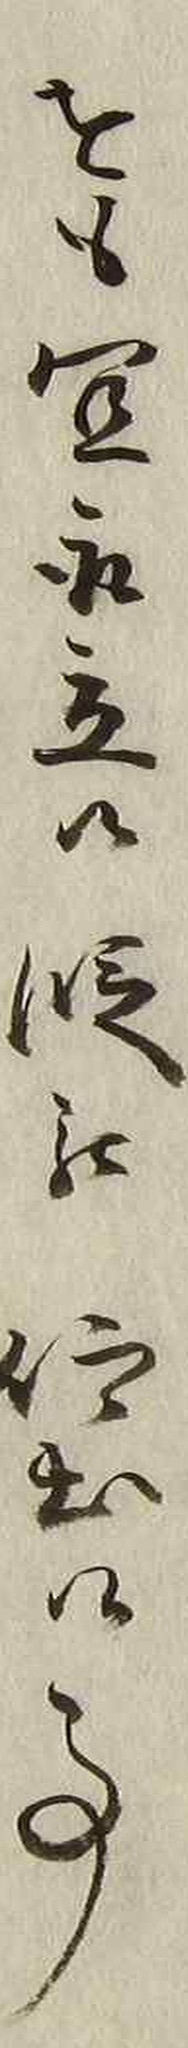をも宜取立候段被仰出候事
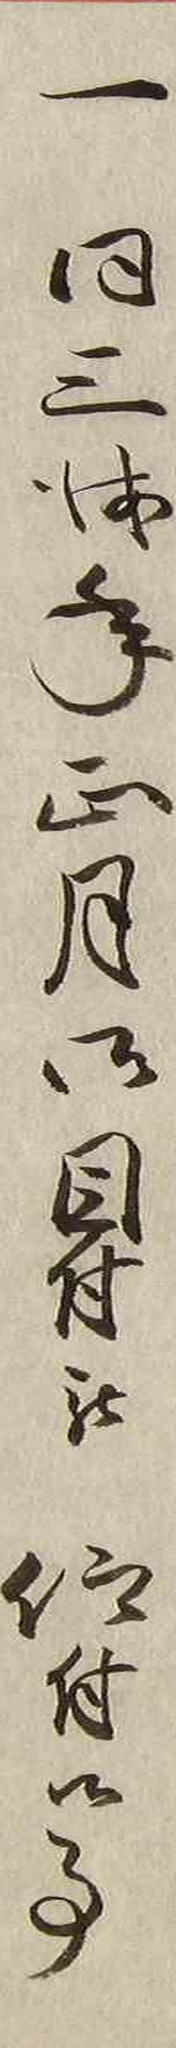一同三戌年正月御目付被仰付候事
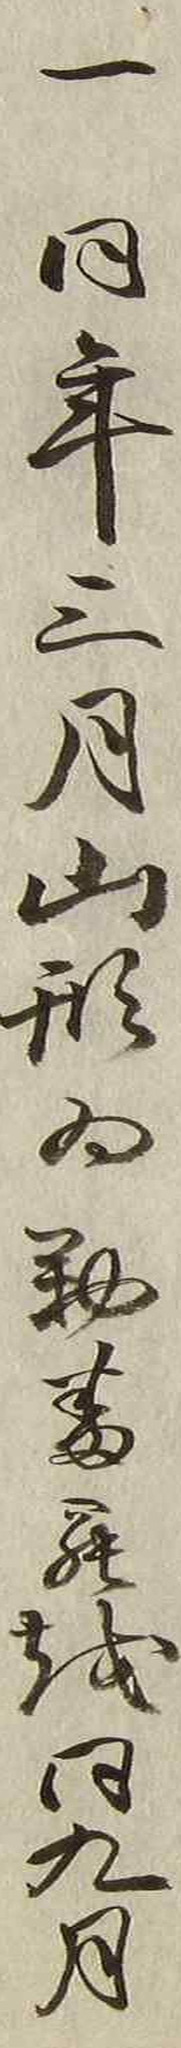一同年三月山形為勤番罷越同九月
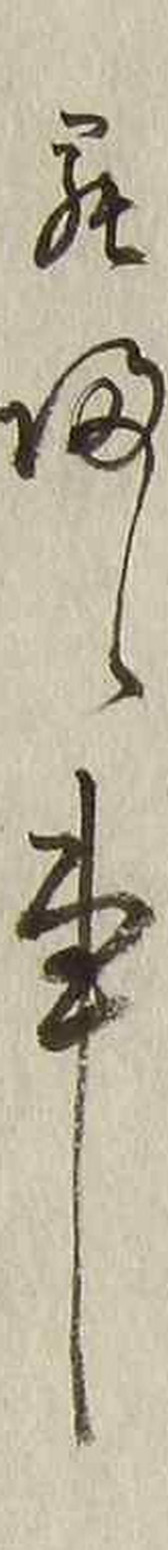罷帰候事
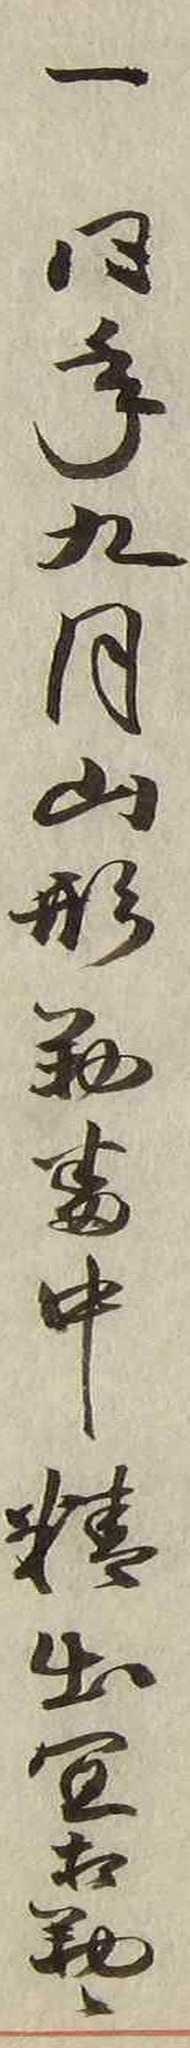一同年九月山形勤番中精出宜相勤候

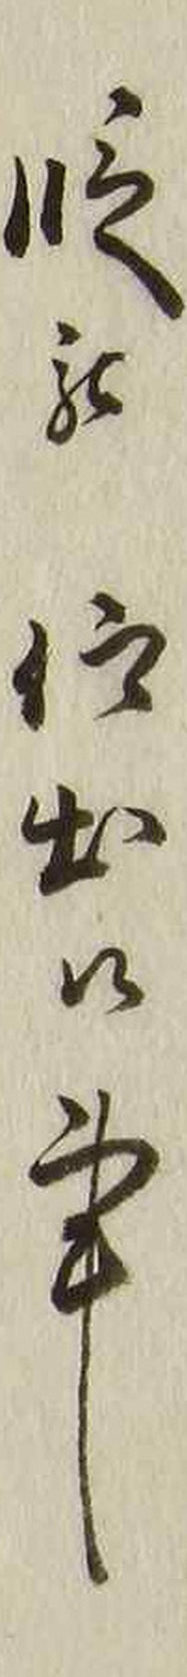段被仰出候事
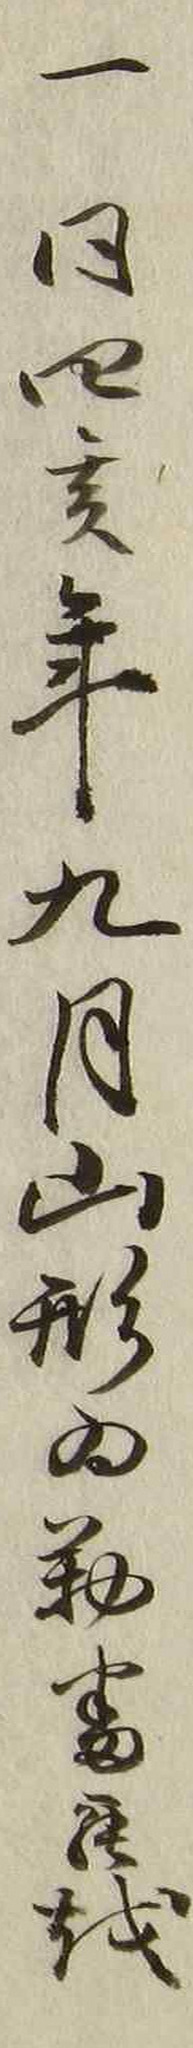一同四亥年九月山形為勤番罷越
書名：諸士系譜　巻之15　い之部15
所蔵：会津若松市立会津図書館
